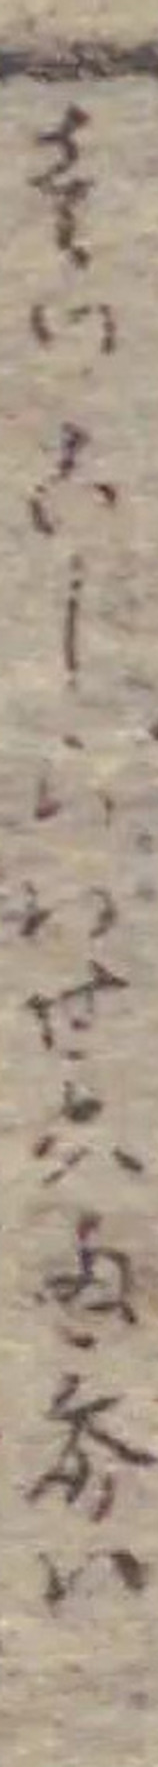壱つこしらはせ六両三分は
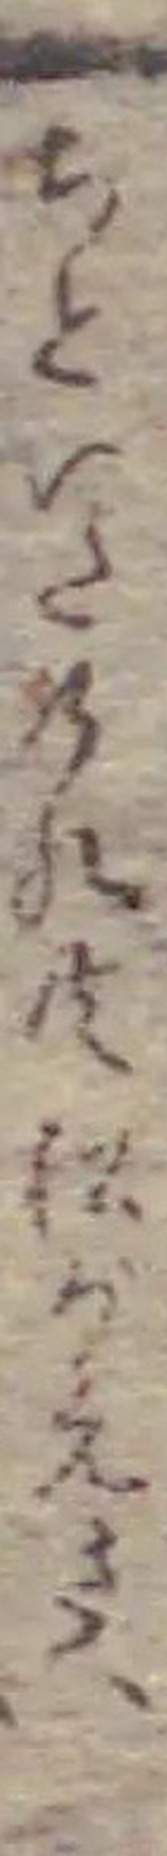ちといたけれ共松がえさへ
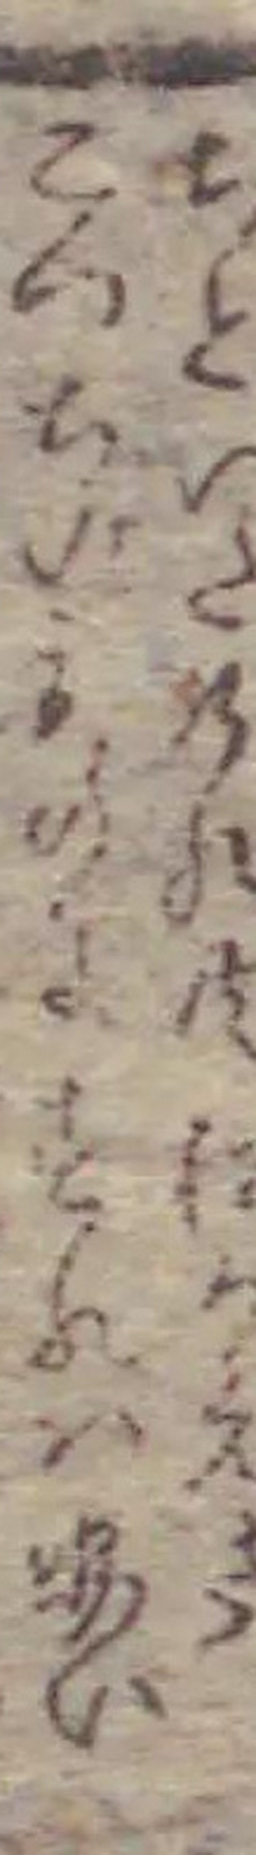こつちのものにすれは安い
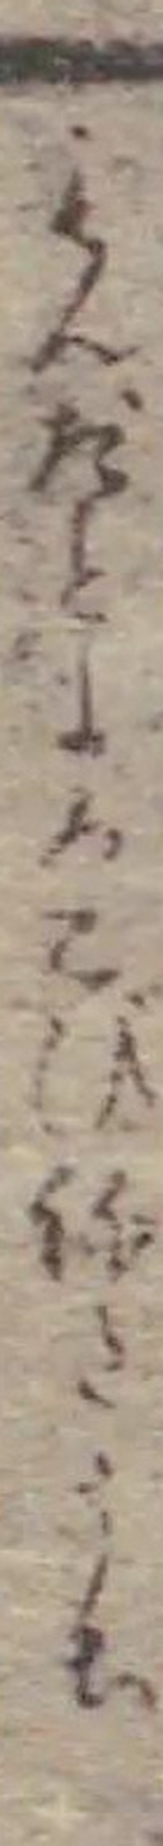もんだとよろこびねたうち
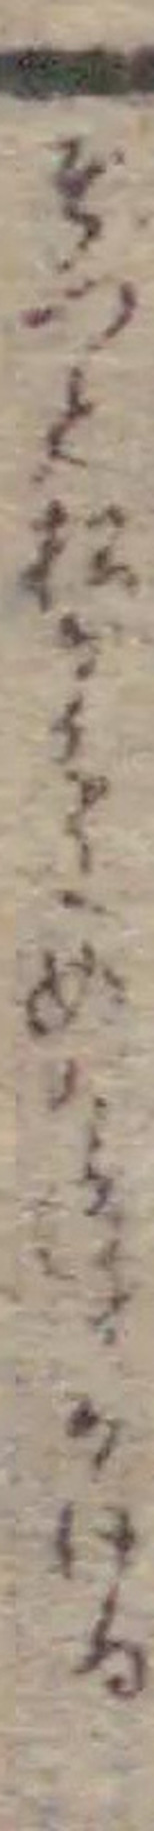そつと松がえにめかねかける

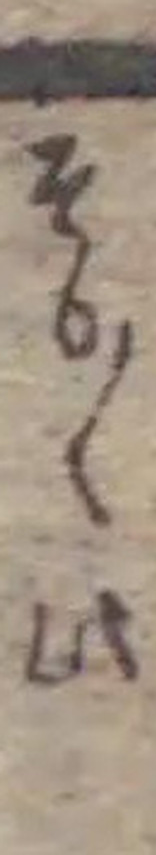そも〳〵此
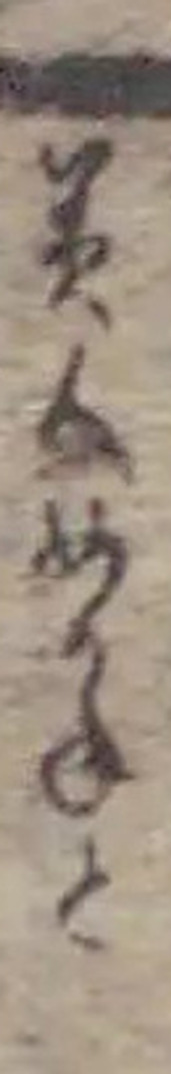美人めかねと
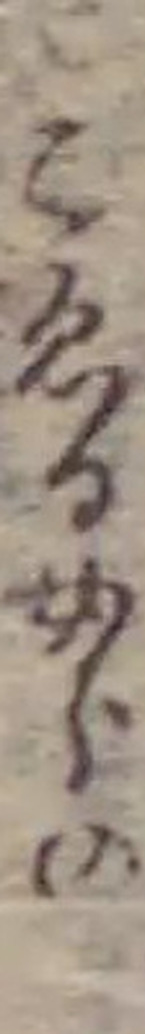きこゑる女郎の
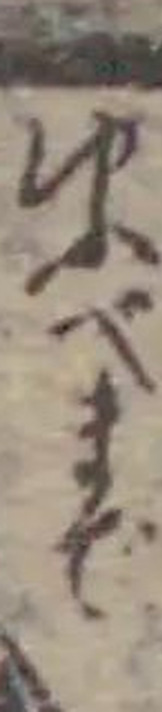ゆふべまで
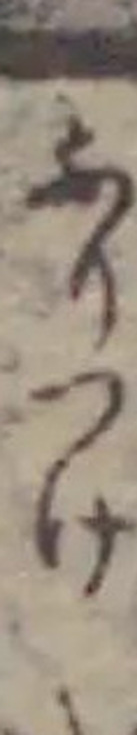ふりつけ
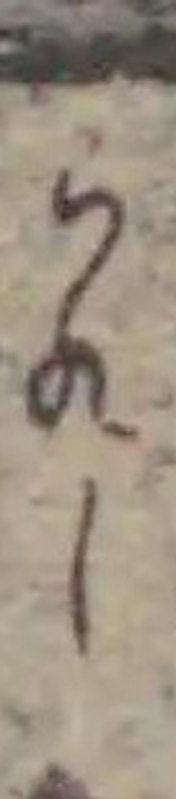られし
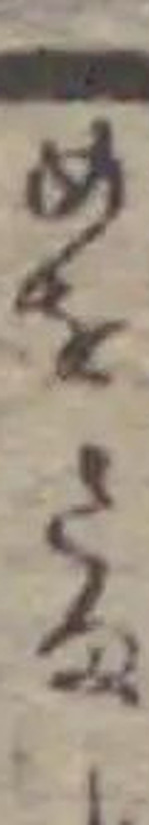めをさま
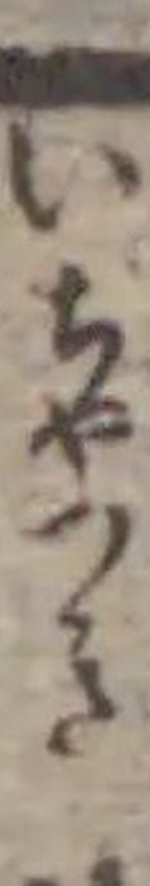いちやつき
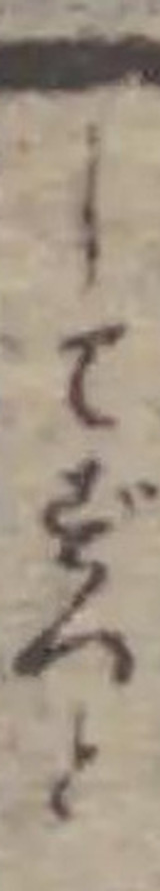してずつと
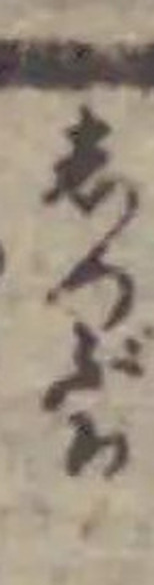しつぶか
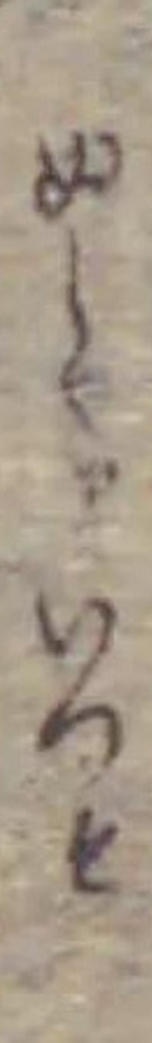ぬしやァいつも
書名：栄増眼鏡徳 3巻
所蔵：国立国会図書館 National Diet Library, JAPAN
